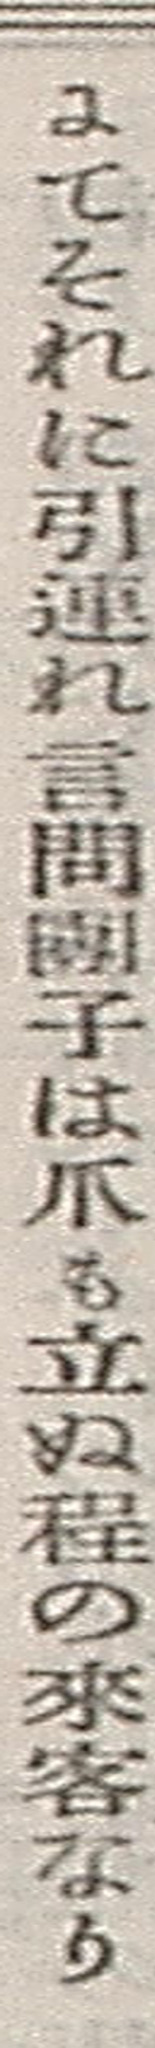にてそれに引連れ言問団子は爪も立ぬ程の来客なり
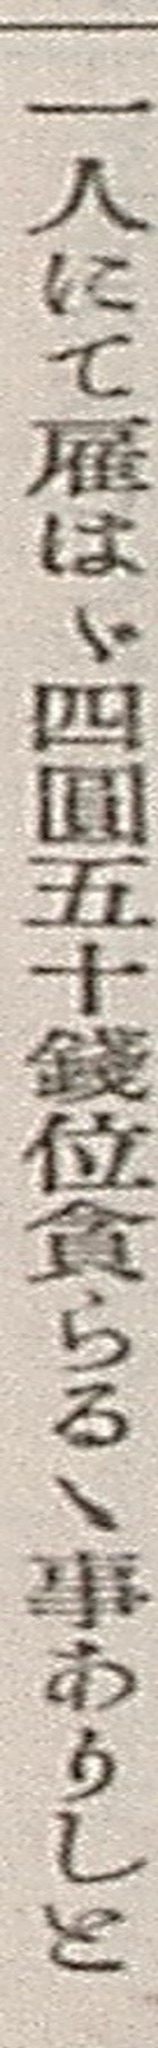一人にて雇はゞ四円五十銭位貪らるゝ事ありしと
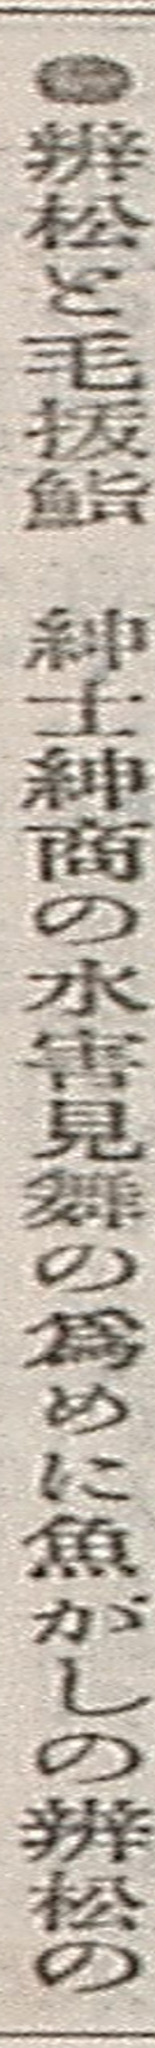●弁松と毛抜鮨紳士紳商の水害見舞の為めに魚がしの弁松の
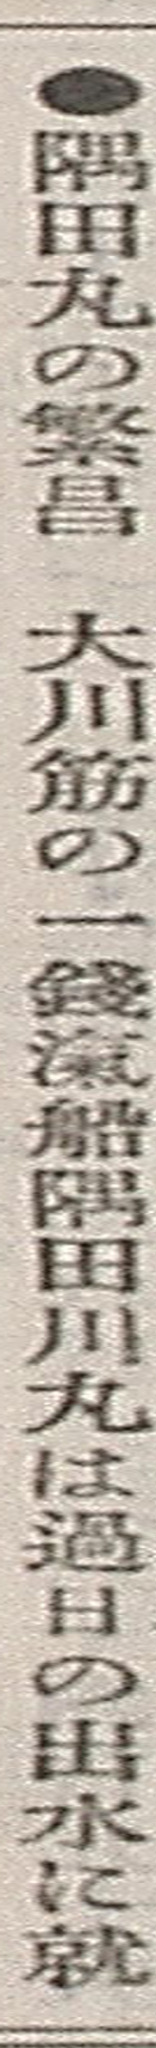●隅田丸の繁昌大川筋の一銭汽船隅田丸は過日の出水に就
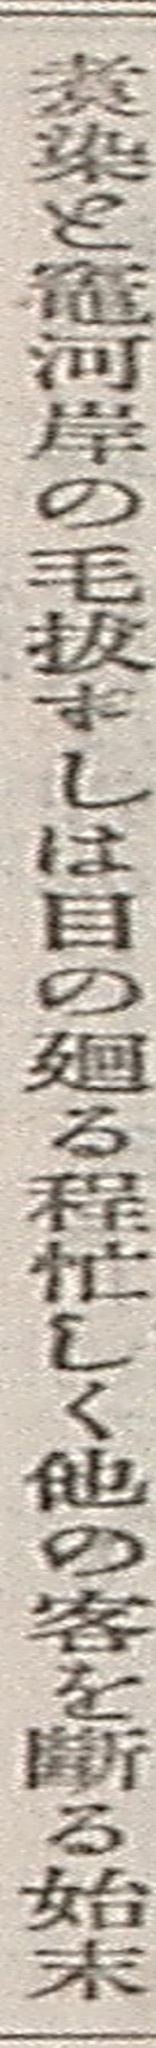煮染と竃河岸の毛抜ずしは目の廻る程忙しく他の客を断る始末
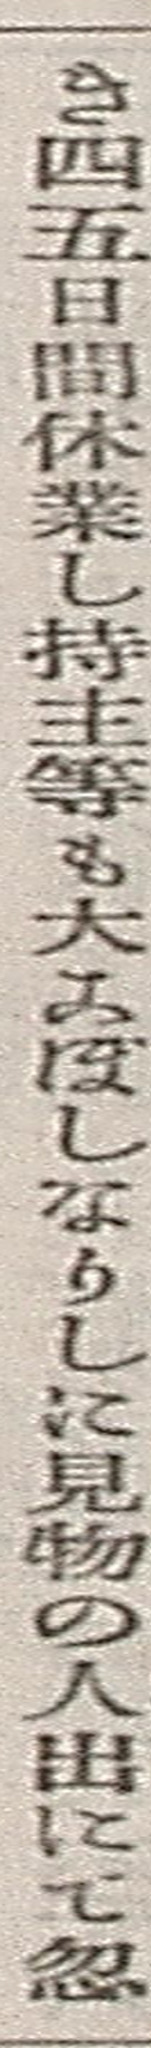き四五日間休業し持主等も大こぼしなりしに見物の人出にて忽
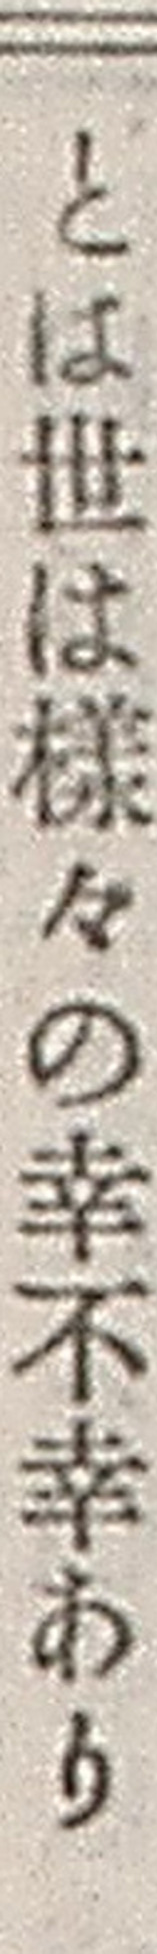とは世は様々の幸不幸あり
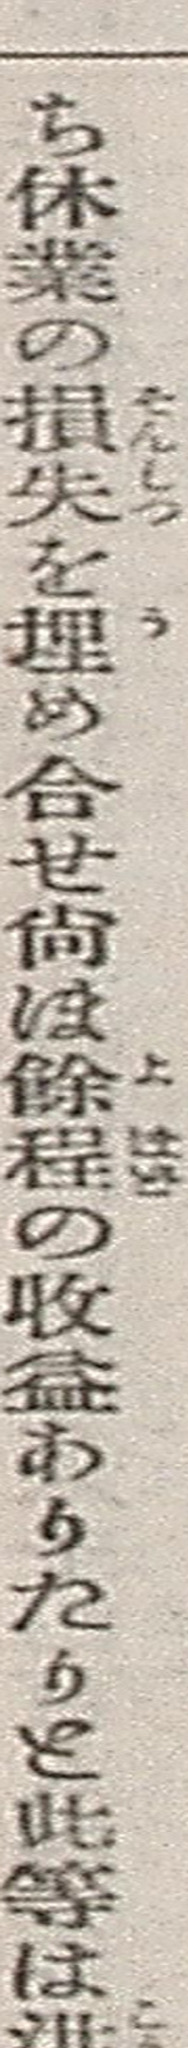ち休業の損失を埋め合せ尚ほ余程の収益ありたりと此等は洪水
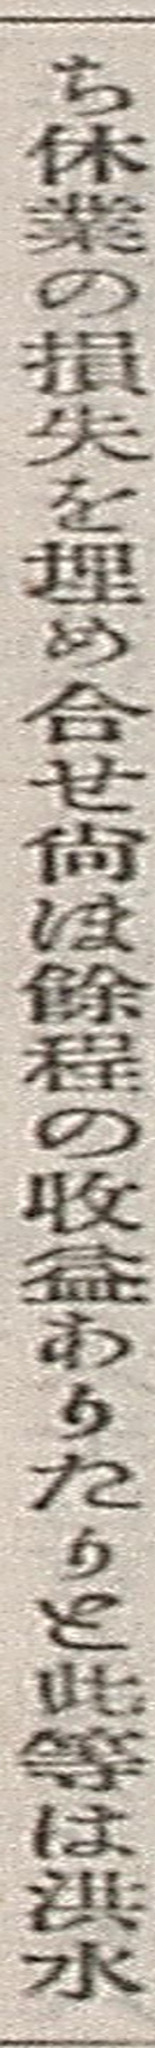ち休業の損失を埋め合せ尚ほ余程の収益ありたりと此等は洪水
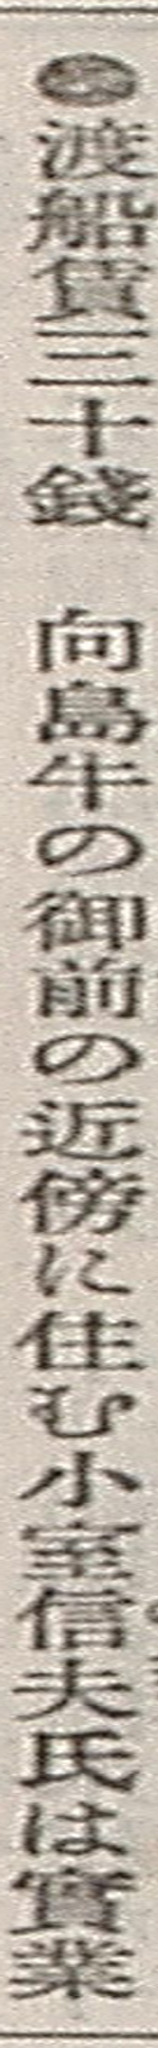●渡船賃三十銭向島牛の御前の近傍に住む小室信夫氏は実業
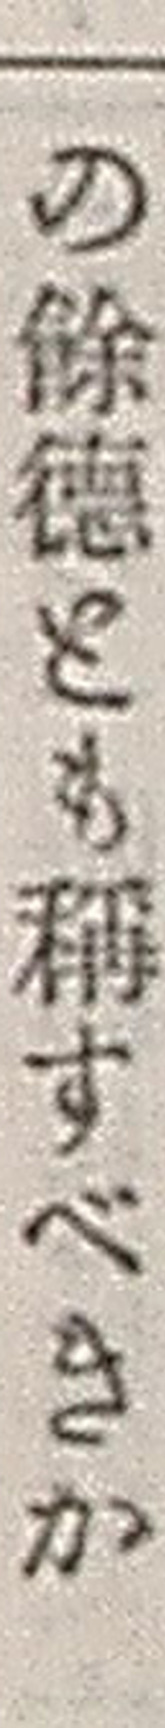の余徳とも称すべきか
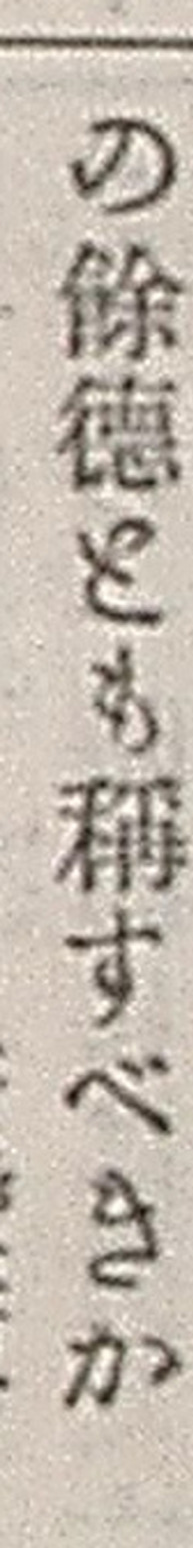の余徳とも称すべきか
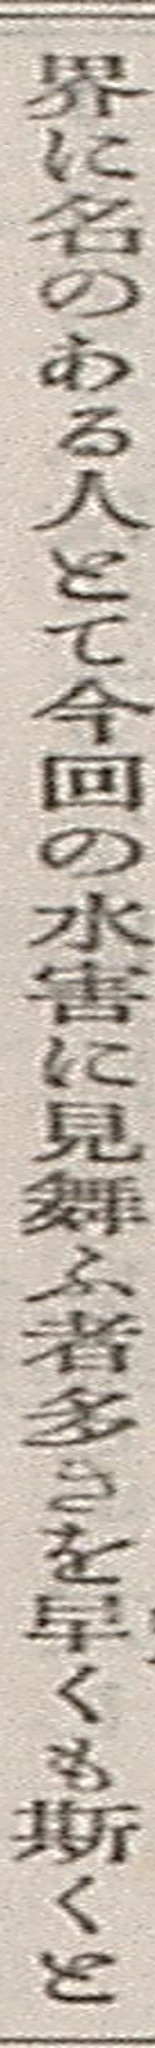界に名のある人とて今回の水害に見舞ふ者多きを早くも斯くと
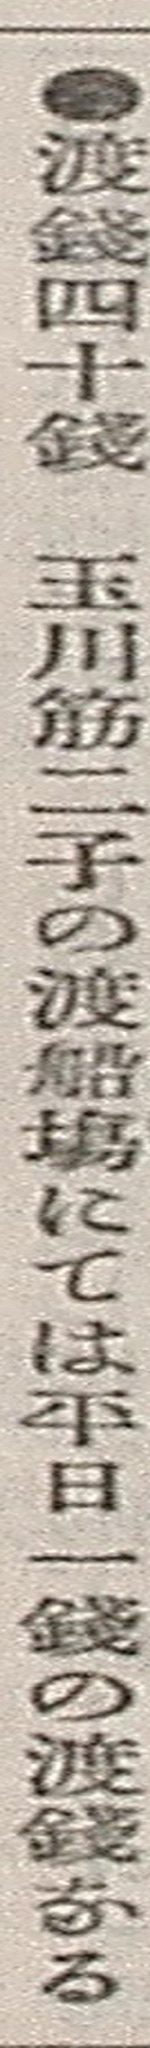●渡船四十銭玉川筋二子の渡船場にては平日一銭の渡銭なる
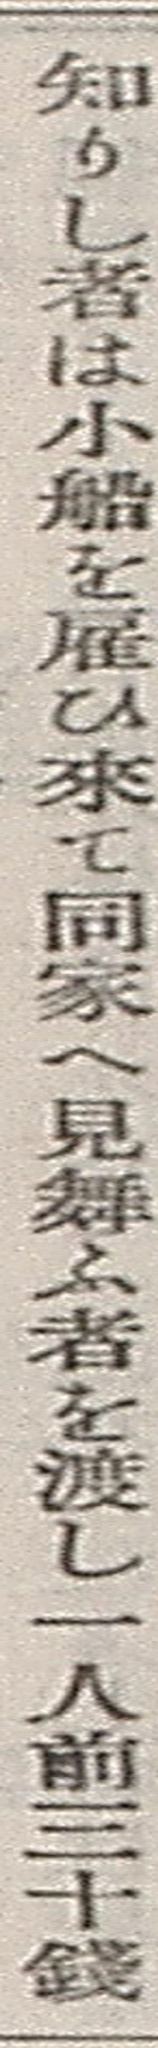知りし者は小船を雇ひ来て同家へ見舞ふ者を渡し一人前三十銭
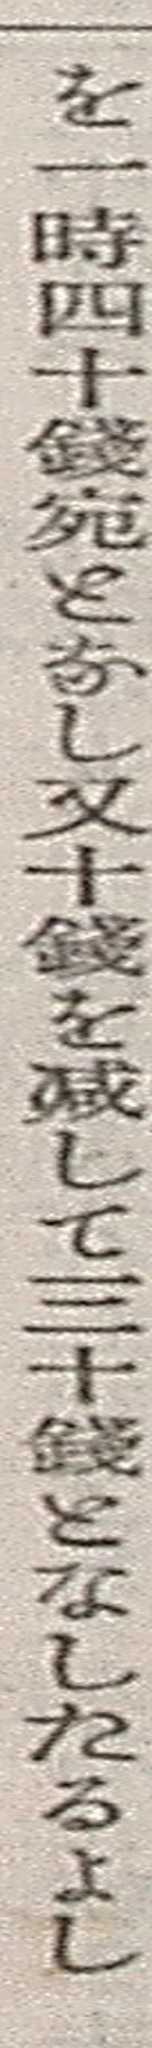を一時四十銭宛となし又十銭を減して三十銭となしたるよし
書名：風俗畫報臨時増刊第百二十四號　洪水地震被害録（上）
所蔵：東京大学地震研究所図書室 Earthquake Research Institute Library, The University of Tokyo, JAPAN
